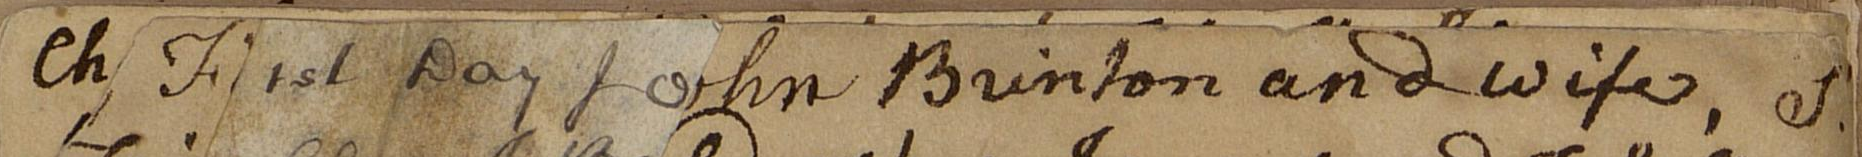First Day John Brinton and wife, S.
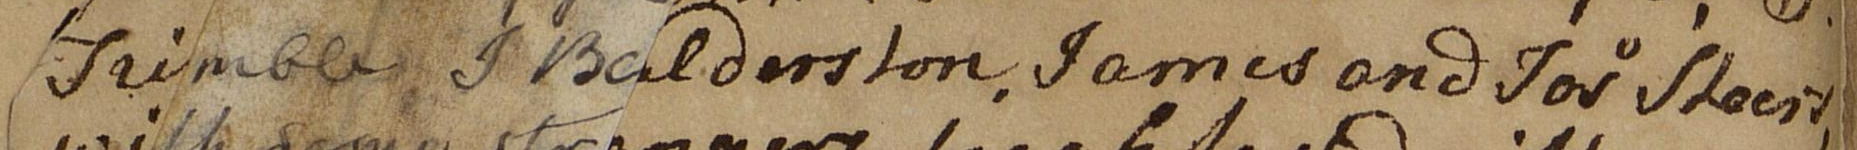Trimble J Balderston, James and Jos^o Stoert
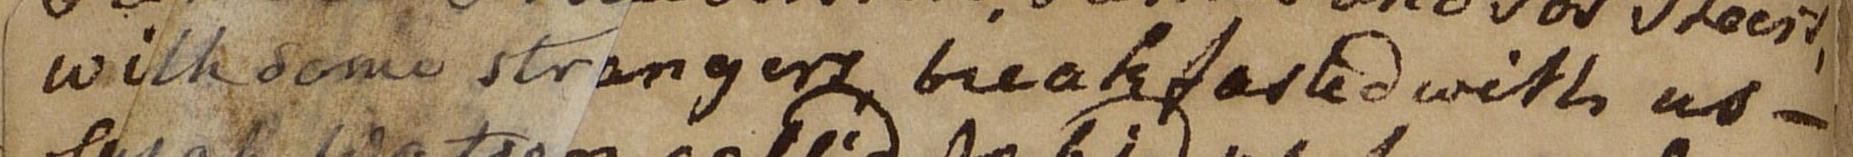with some strangers, breakfasted with us-
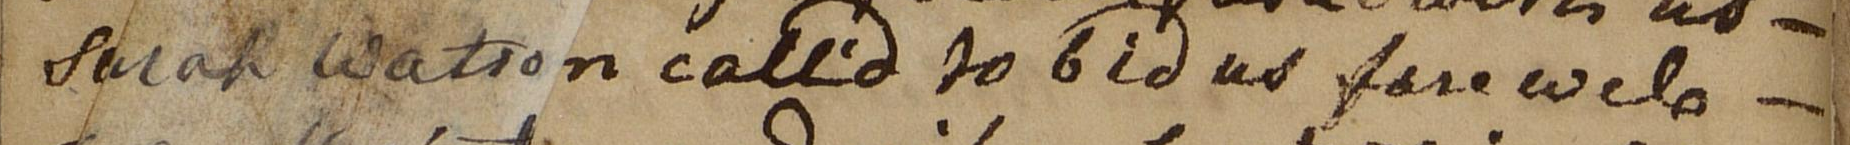Sarah Watson call'd to bid us farewel-
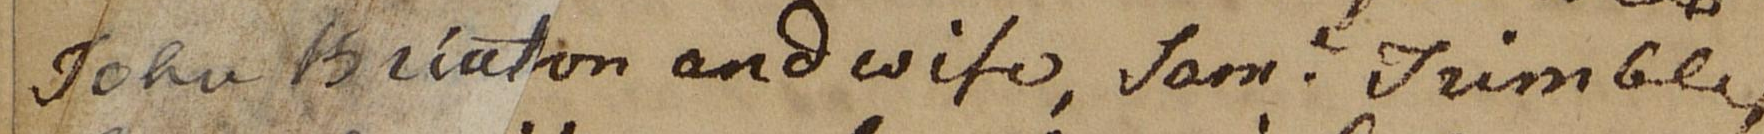Johu Brinton and wife, Sam^l. Trimble,
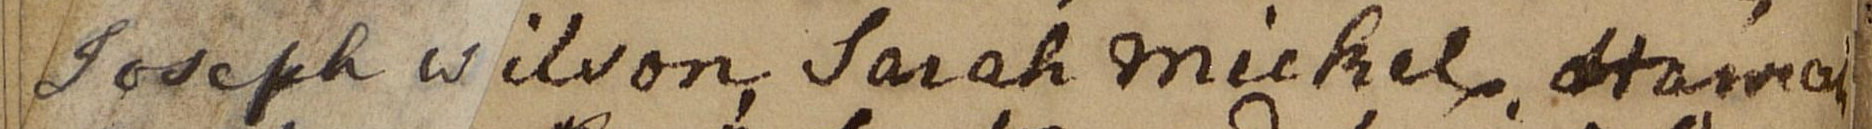Joseph Wilson, Sarah Mickel, Hannah
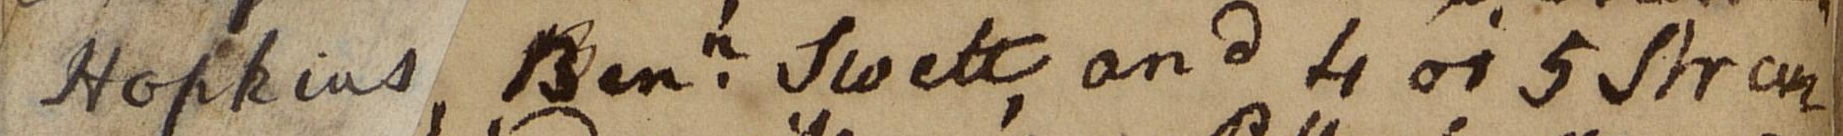Hopkins, Ben^n Swett and 4 or 5 Stran
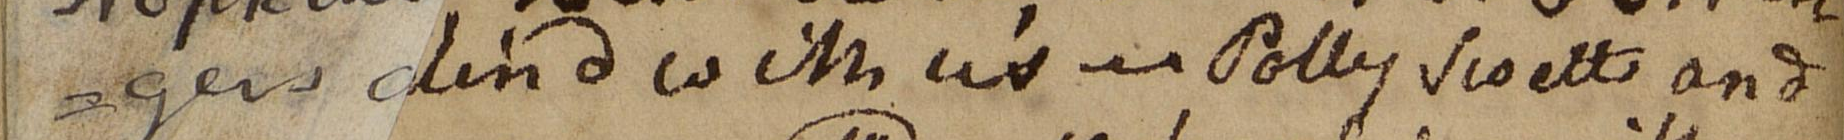-gers din'd with us- Polly Swett and
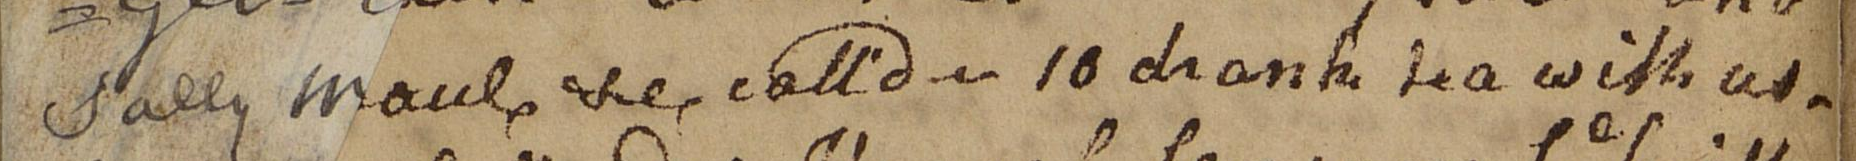Sally Maul &c call'd- 10 drank tea with us,
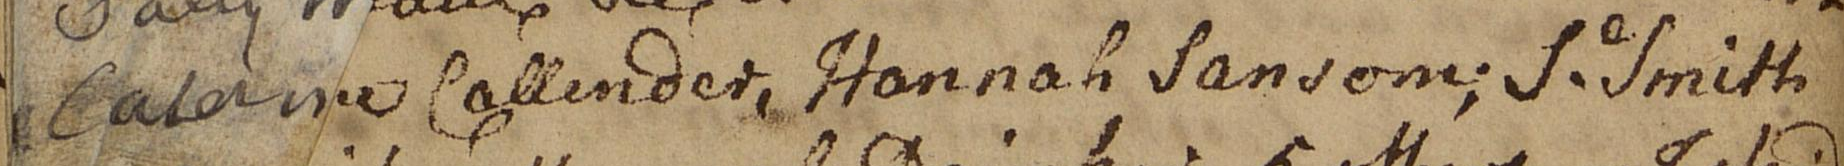Caterine Callender, Hannah Sansom; S.^l Smith
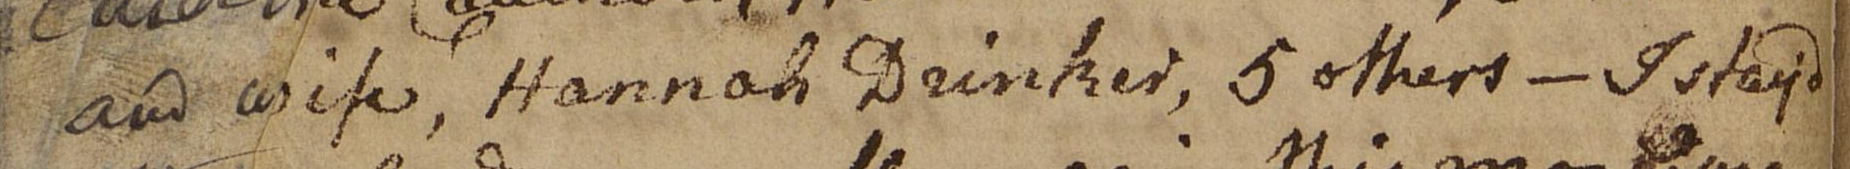and wife, Hannah Drinker, 5 others- I stay'd
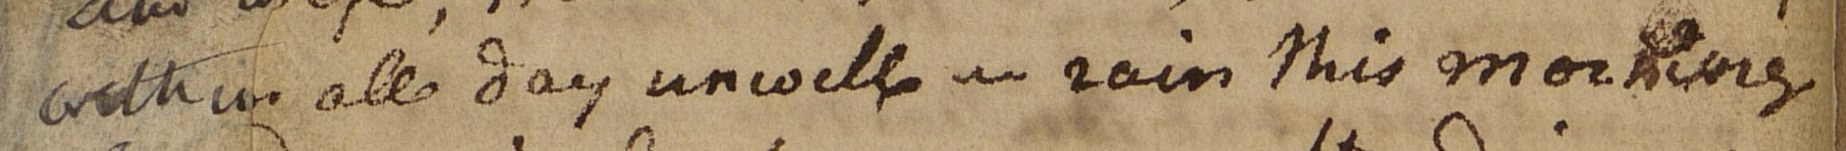within all day unwell- a rain this morn ^g ing
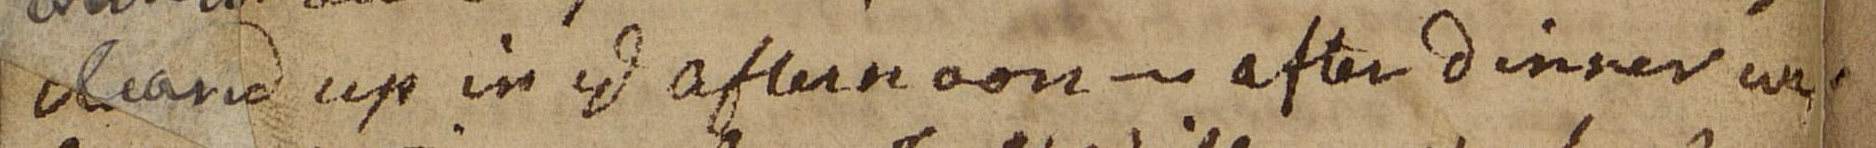cleard up in y^e afternoon- after dinner we
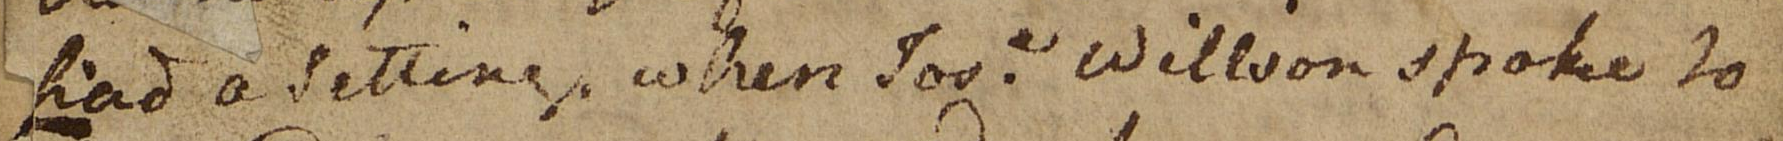had a setting, when Jos.^e Willson spoke to
